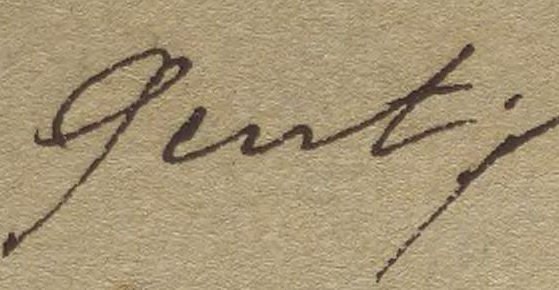Gent.
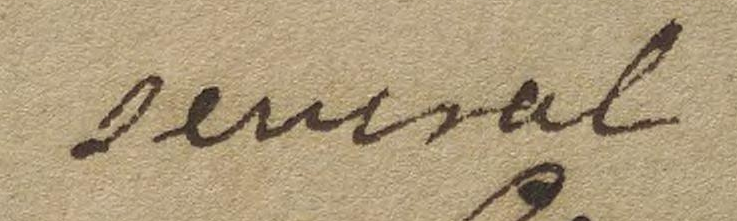several
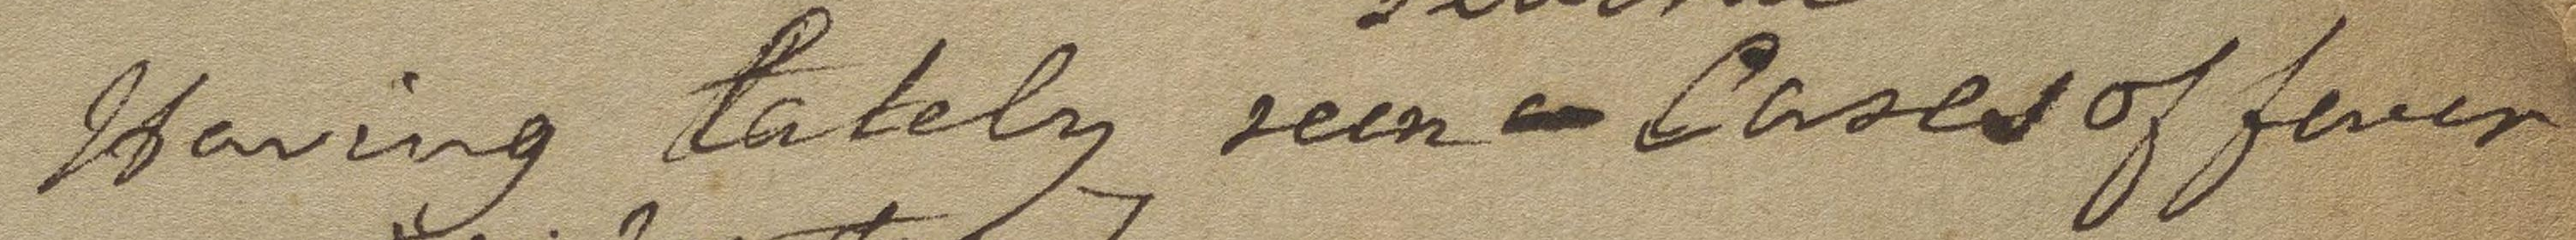Having lately seen [a] cases of fever
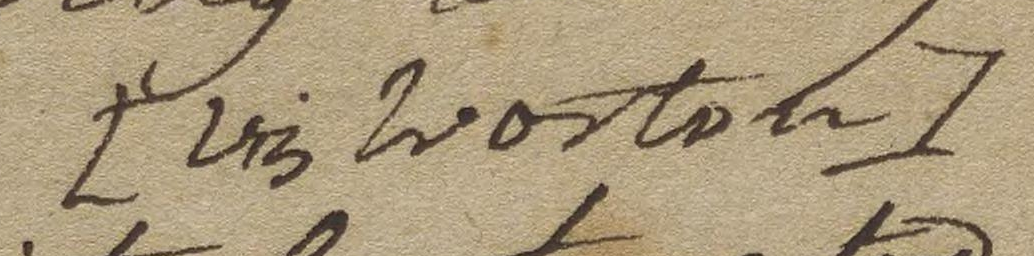[viz Morton]
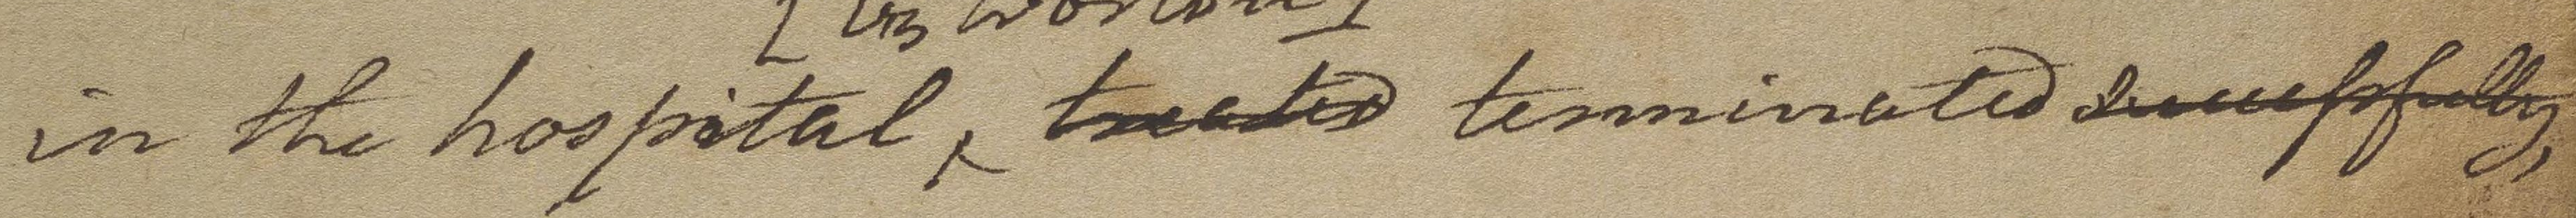in the hospital ^ [treated] terminated [successfully]
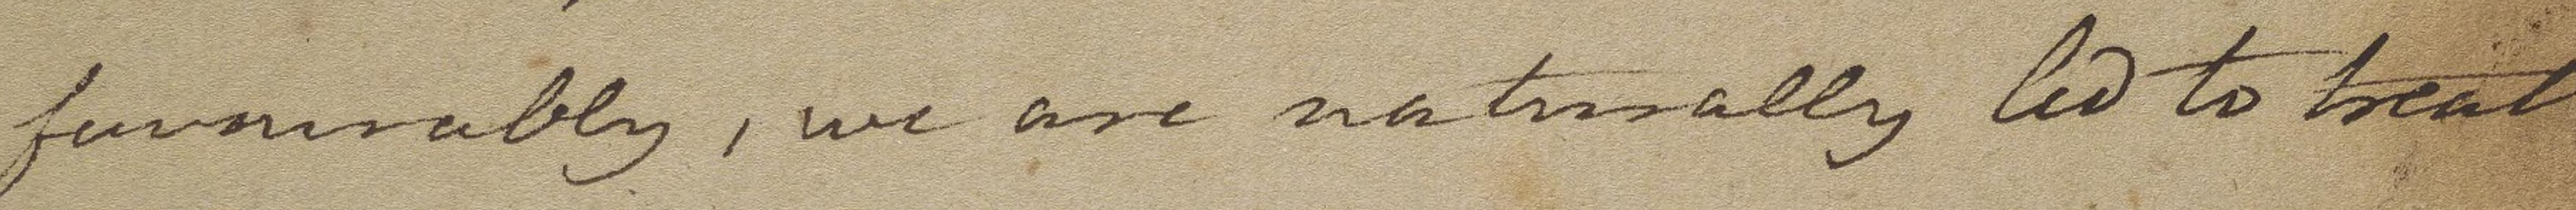favorably, we are naturally led to treat
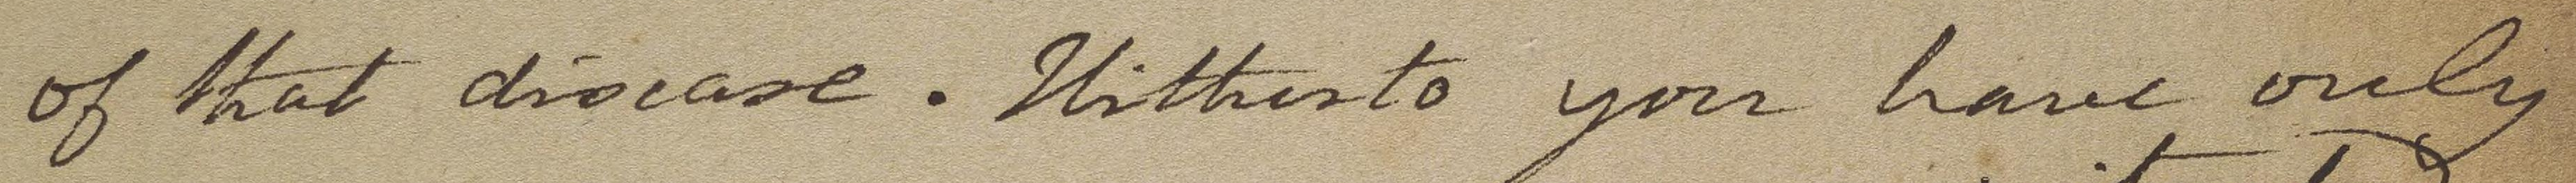of that disease. Hitherto you have only
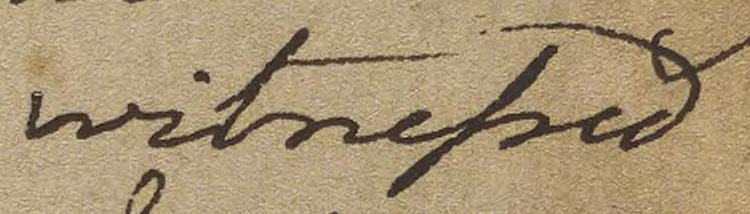witnessed
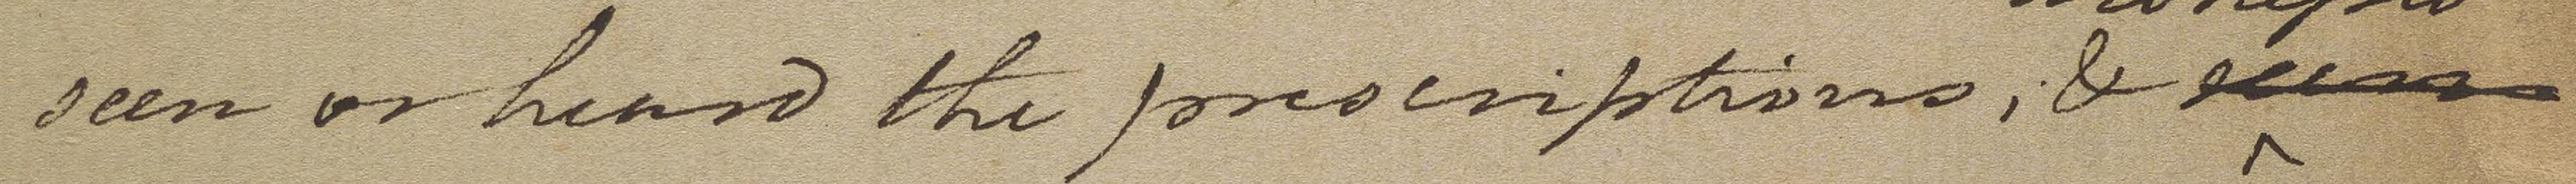seen or heard the prescriptions, & [seen] ^
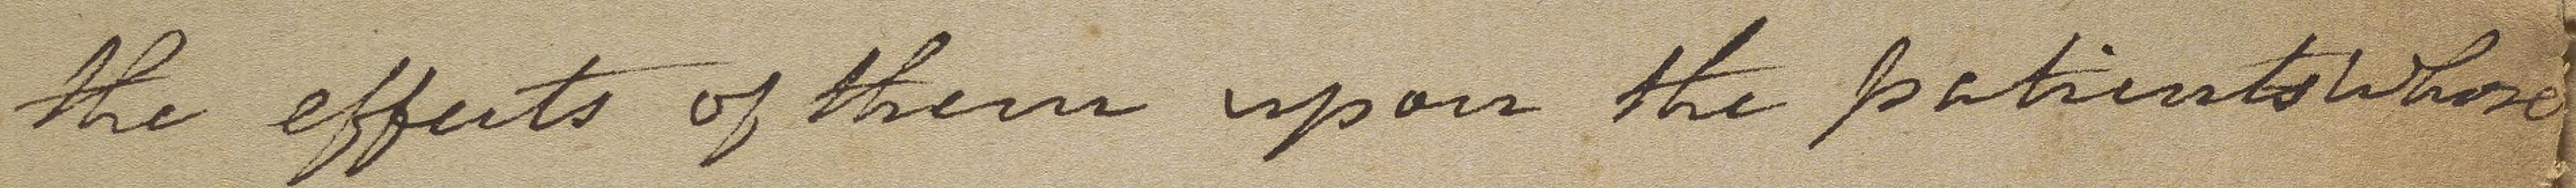the effects of them upon the patients whose
